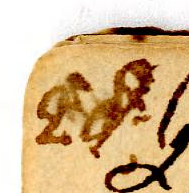28
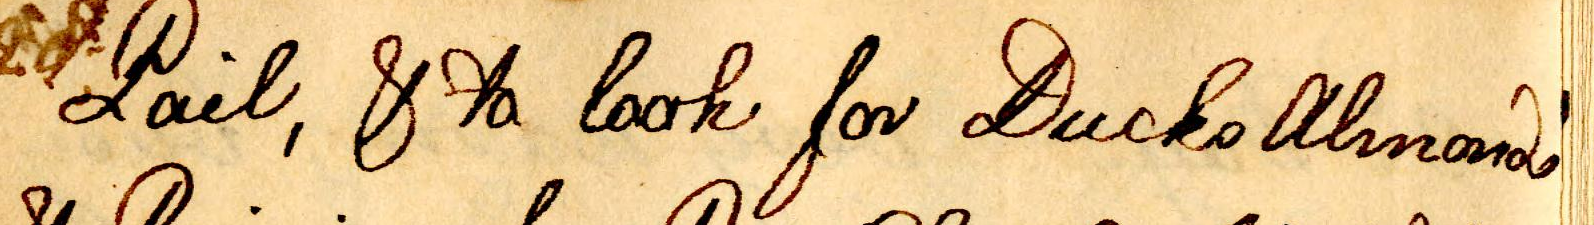Pail, & to look for Ducks Almonds
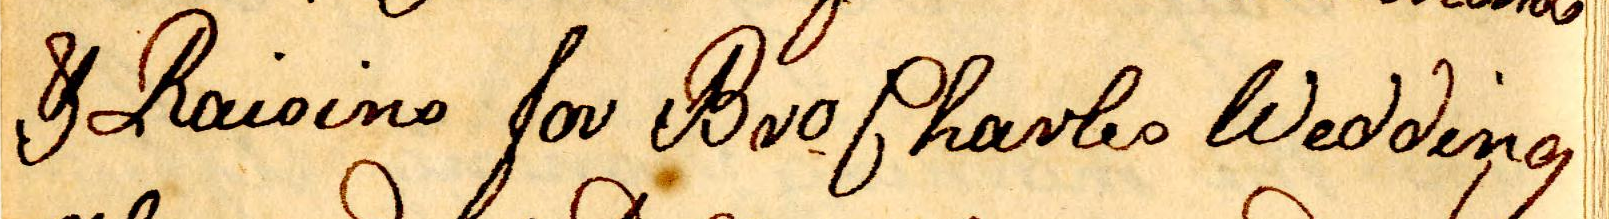& Raisins for Bro Charles Wedding
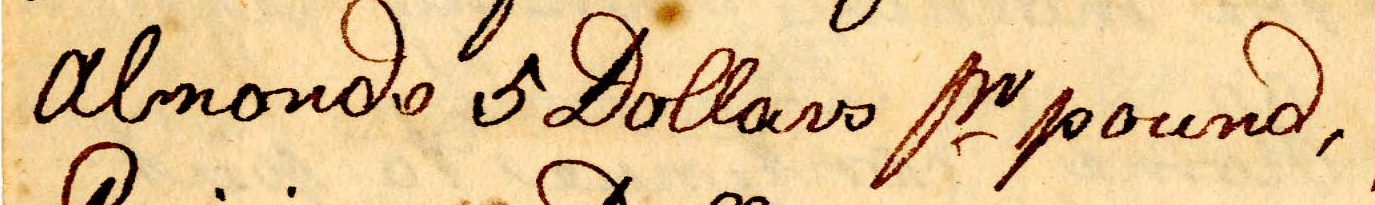Almonds 5 Dollars p^r pound,
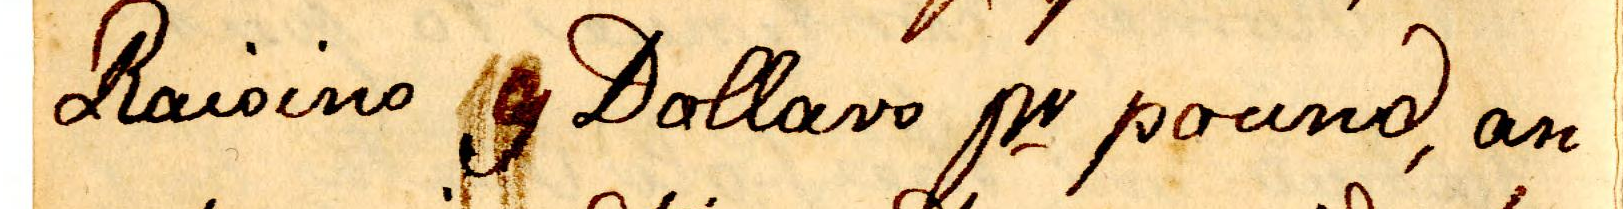Raisins 9 Dollars p^r pound, an
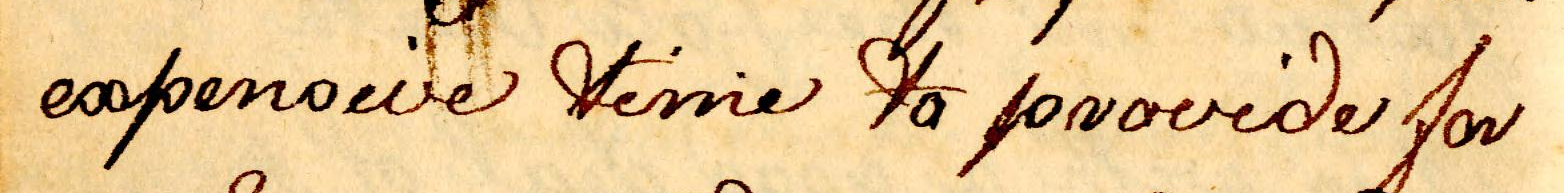expensive time to provide for
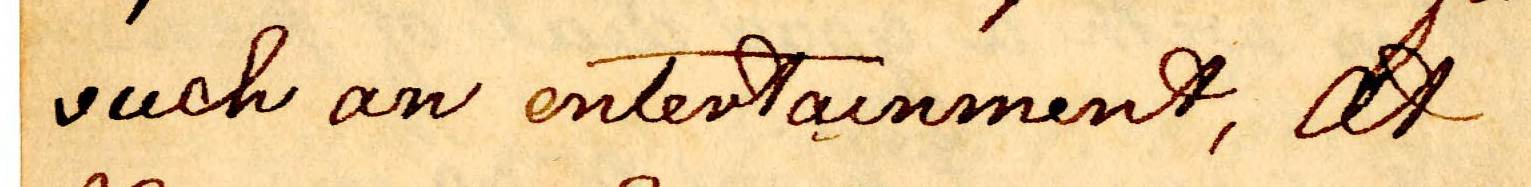such an entertainment, At
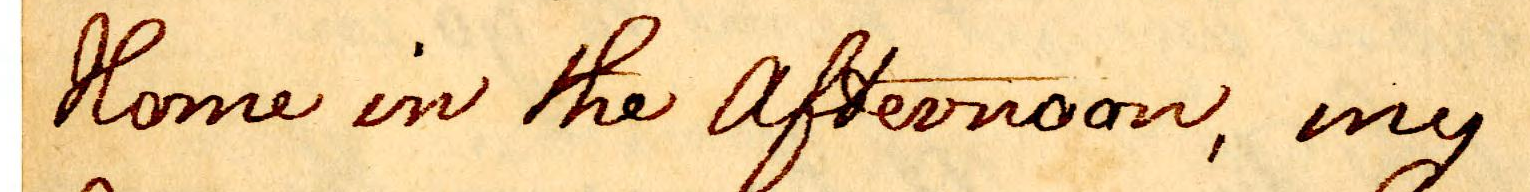Home in the Afternoon, my
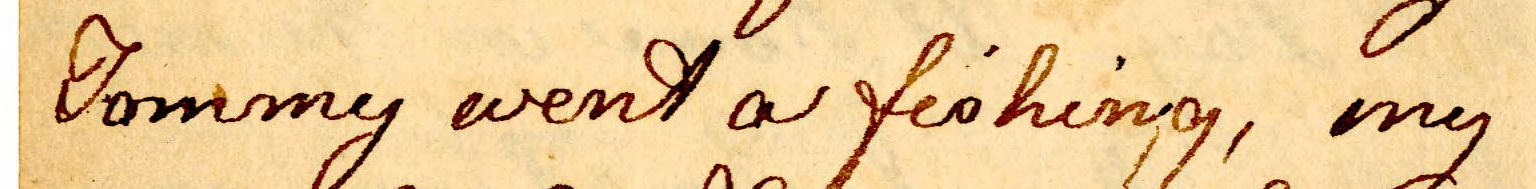Tommy went a fishing, my
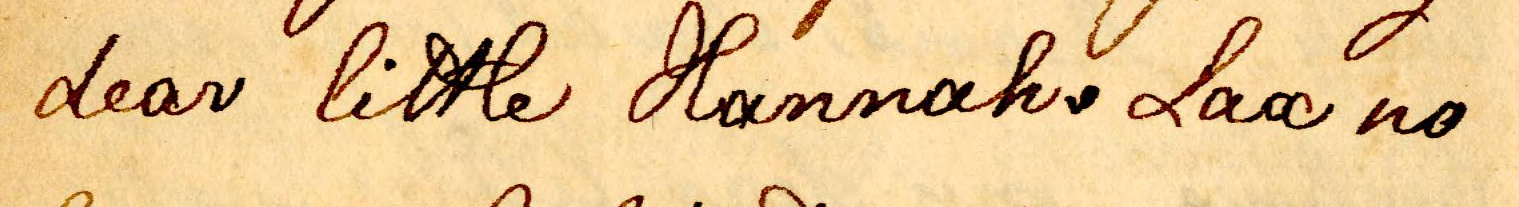dear little Hannahs Lax no
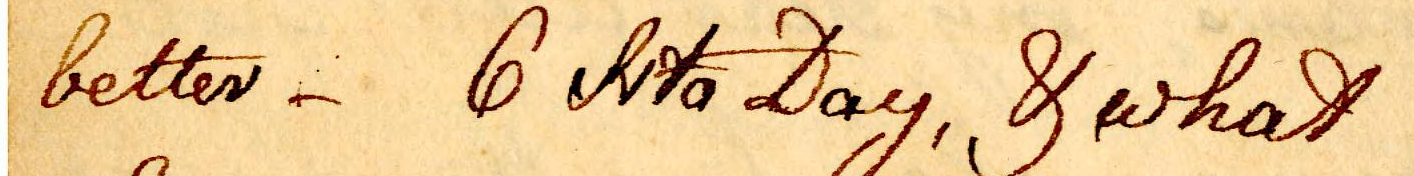better- 6 St to Day, & what
